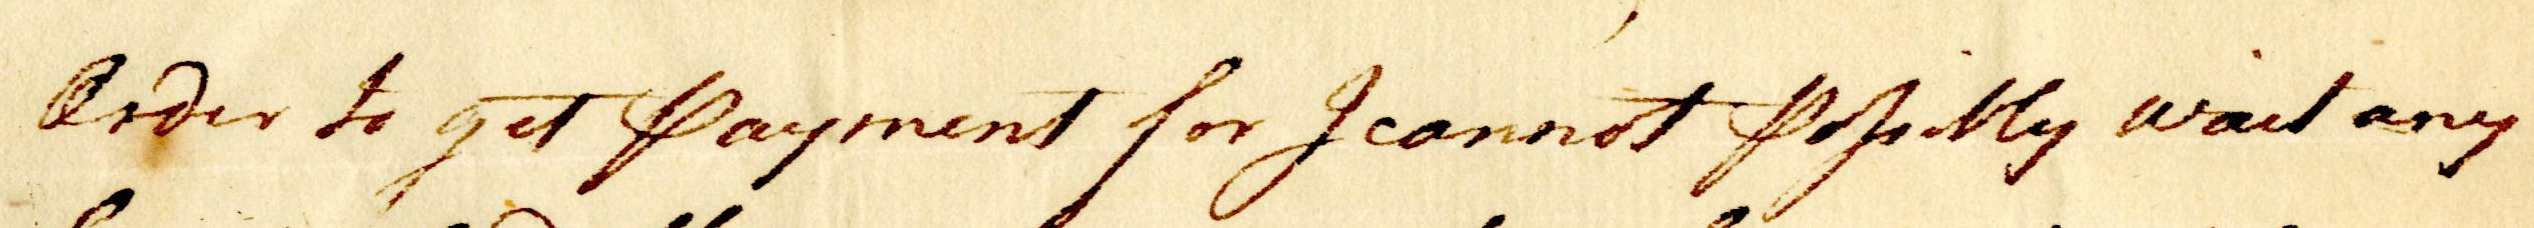order to get Payment for I cannot possibly wait any
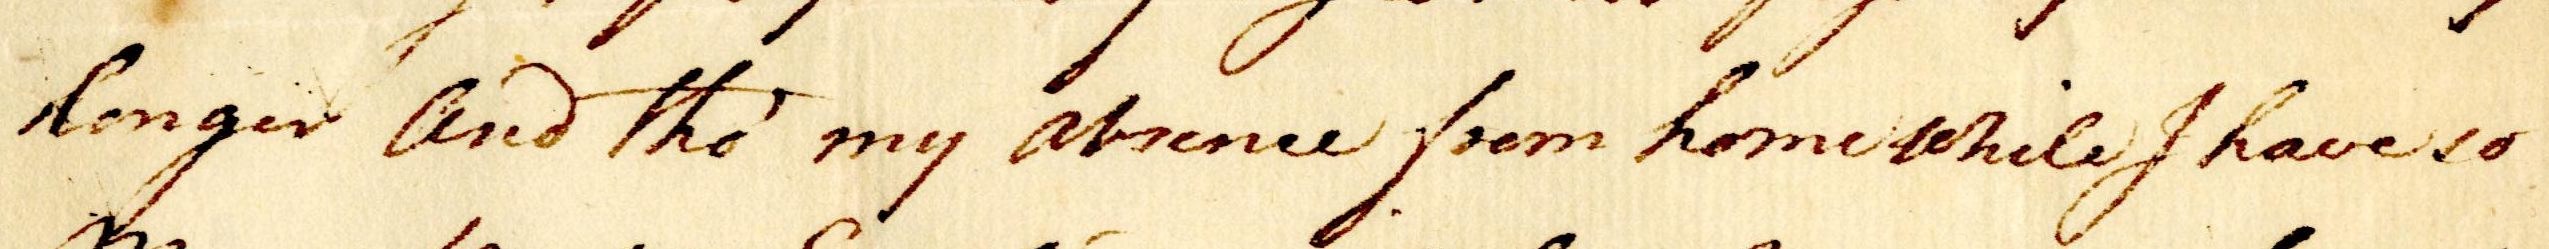longer and tho' my absence from home while I have so
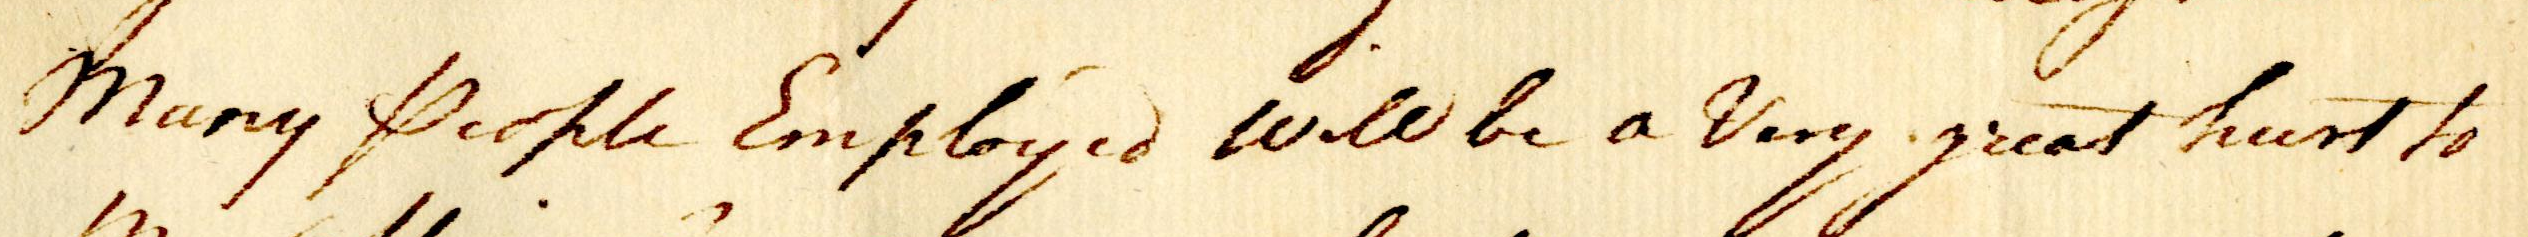Many People Employed will be a Very great hurt to
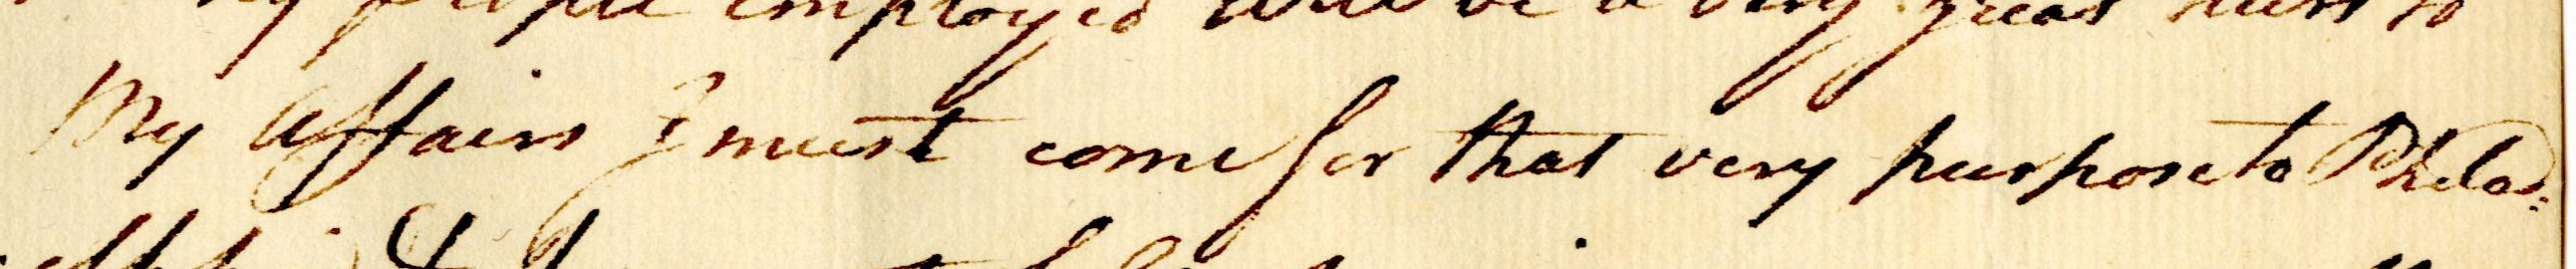My Affairs I must come for that very purpose to Philad-
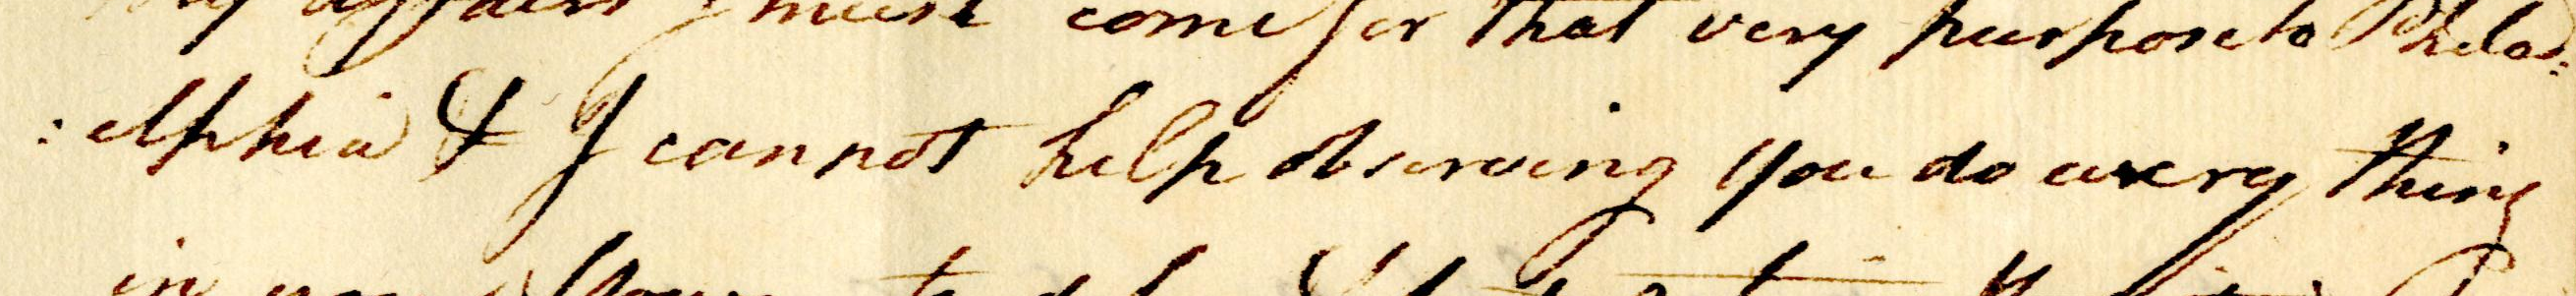-elphia & I cannot help observing you do every thing
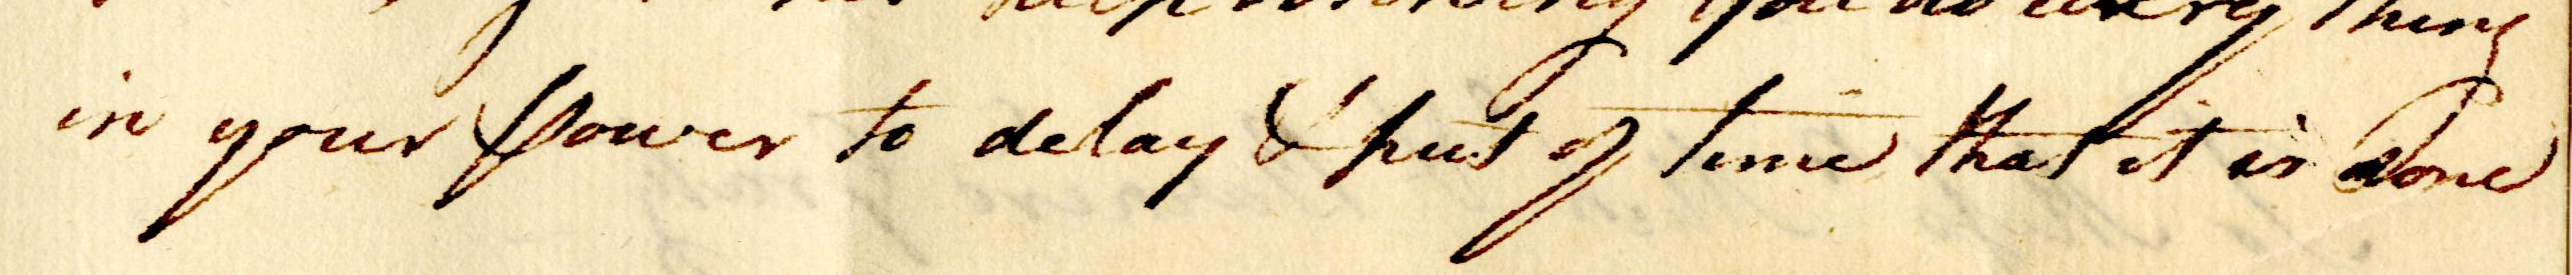in your power to delay & put of time that it is done
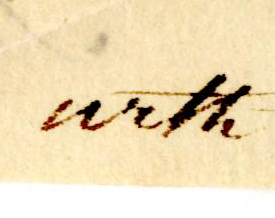with
